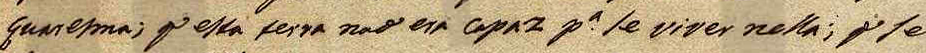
quaresma; q̄ esta terra nao era capaz p.a se viver nella; q̄ se
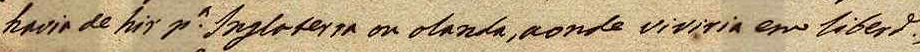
havia de hir p.a Inglaterra ou olanda, aonde viviria em Liberd.e,
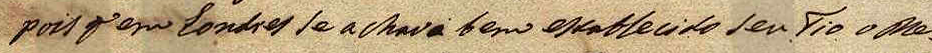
pois q̄ em Londres se achava bem establecido seu Tio o Me
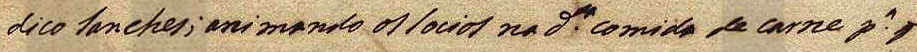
dico Sanches; animando os socios na d.a comida de carne p.a q̄
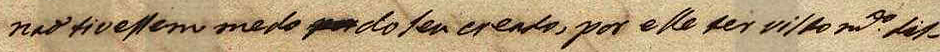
naõ tivessem medo _ do seu creado, por elle ter visto m.to dis
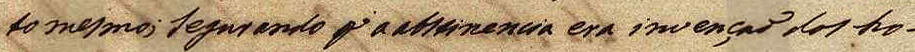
to mesmo; segurando q̄ a abstinencia era invençaõ dos ho
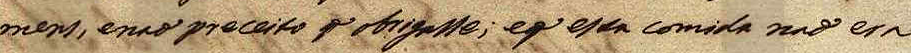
mens, e naõ preceito q̄ obrigasse, e q̄ esta comida naõ era
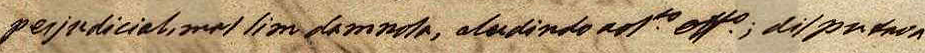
perjudicial, mas sim damnosa, aludindo a s.to off.o; disputava
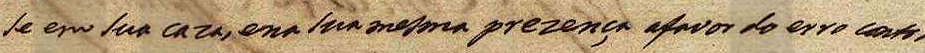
se em sua caza, e na sua mesma prezença a favor do erro contra
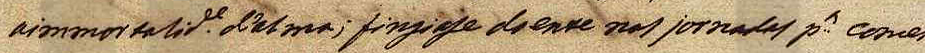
a immortalid.e d'alma; fingiase doente nas jornadas p.a comer
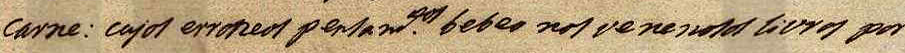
carne: cujos erroneos pensam.tos bebeo nos venenosos livros por
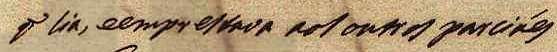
q̄ lia e emprestava aos outros parciáes.
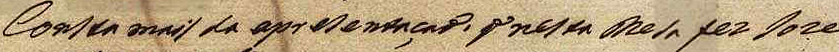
Consta mais da apresentaçaõ, q̄ nesta Mesa fez Ioze
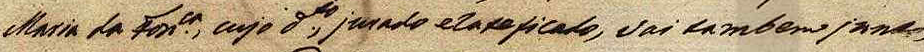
Maria da Fon.ca, cujo d.to, jurado e Rateficado, vai tambem junto,
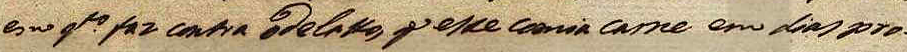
emq.to faz contra o delatto, q̄ este comia carne em dias pro
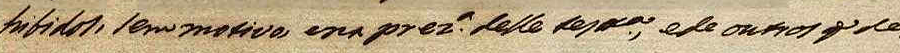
hibidos, sem motivo e na prez.a delle test.a, e de outros q̄ de
